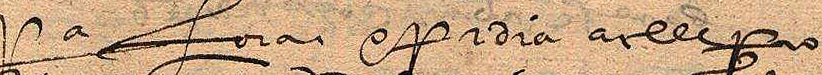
ꝑa fora e pidia a elle pro
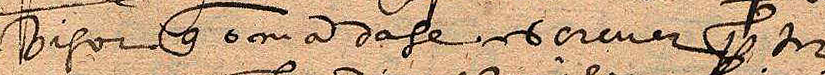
visor q̄ o mādase escreuer p̄o ter
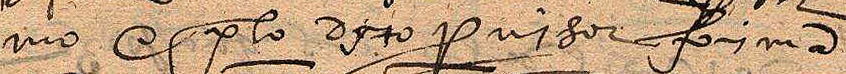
mo e p̄lo dyto ꝓujsor foy mā
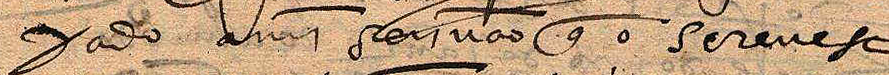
dado a mī scriuão q̄ o screuese
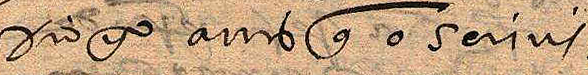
diogo aires q̄ o scriuj
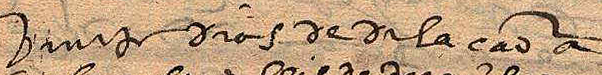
Vimte dias de dilação a
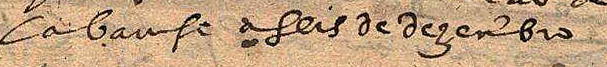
cabanse a seis de dezenbro
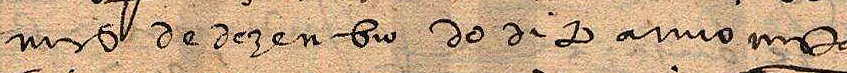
mes de dezenbro do dito anno nesta
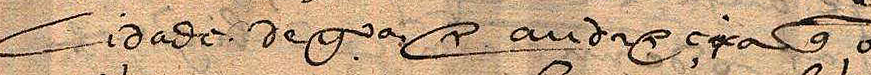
Çidade de goa ē audiēçia q̄ o
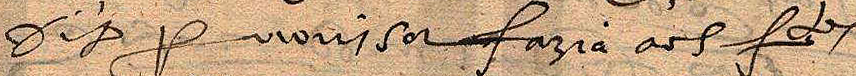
dito proujsor fazia aos ftos
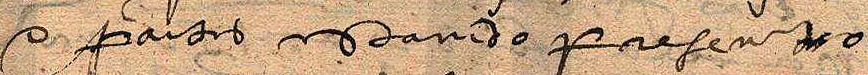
e partes estamdo presemte o
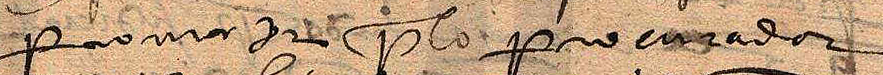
prometor p̄lo procurador
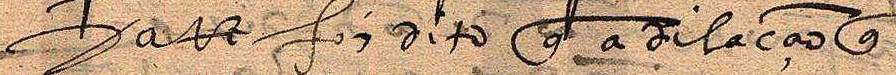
da Re foy dito q̄ a dilação q̄
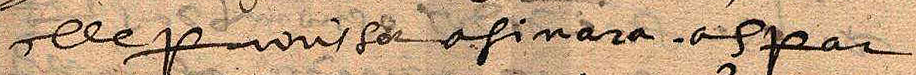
elle prouisor asinara as par
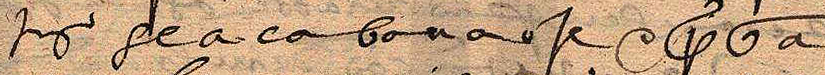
tes se acabaua oJe e p̄q̄ a
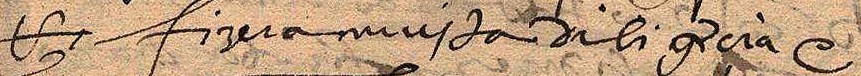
Re fizera mujta diligēçia e
